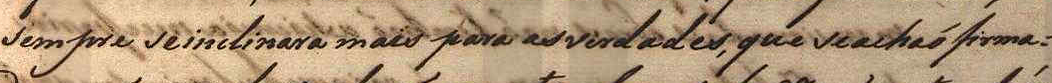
sempre se inclinará mais para as verdades, que se achaõ firma
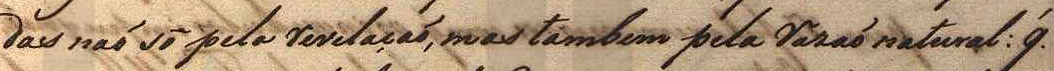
das naõ só pela revelaçaõ, mas tambem pela Razaõ natural: q̄
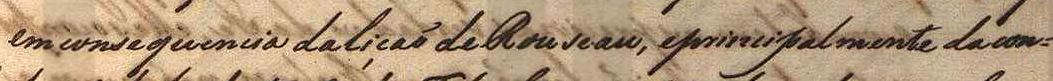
em consequencia da liçaõ de Rouseau, e principalmente da con
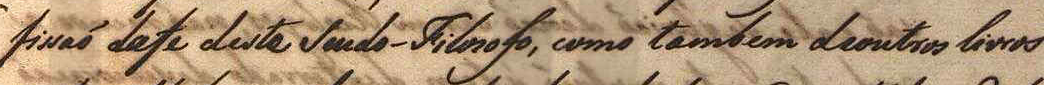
fissaõ da fe deste Seudo-Filosofo, como tambem de outros livros
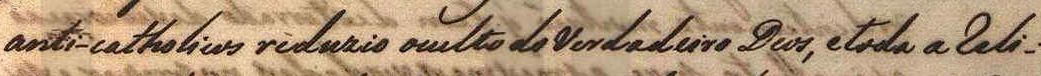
anti-catholicos reduzio o culto do verdadeiro Deos, e toda a Reli
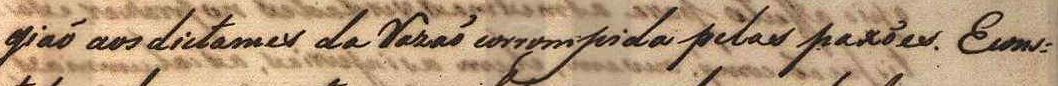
giaõ aos dictames da Razaõ corrompida pelas paxões. E cons
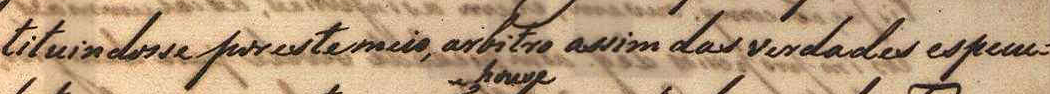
tituindosse por este meio, arbitro assim das verdades especu
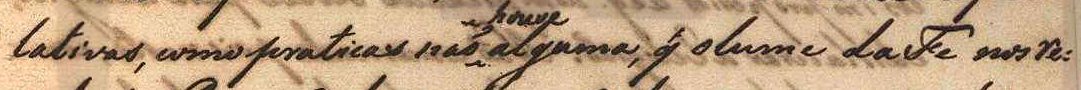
lativas, como praticas naõ houve alguma, q̄ o lume da Fé nos re
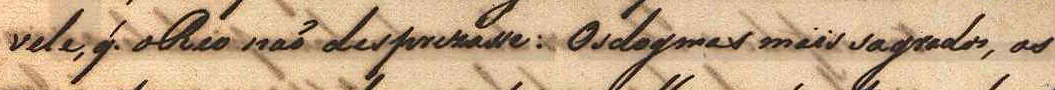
vele, q̄ o Reo naõ desprezasse: Os dogmas mais sagrados, os
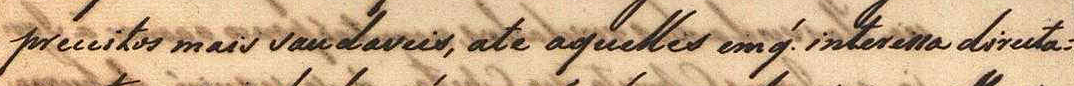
preceitos mais saudaveis, ate aquelles em q̄ interessa directa
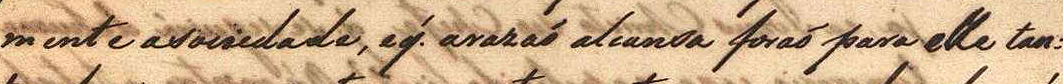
mente a sociedade, e q̄ a razaõ alcansa foraõ para elle tan
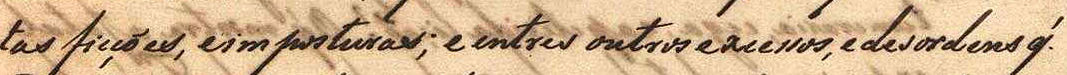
tas ficções, e imposturas; e entres outros excessos, e desordens q̄
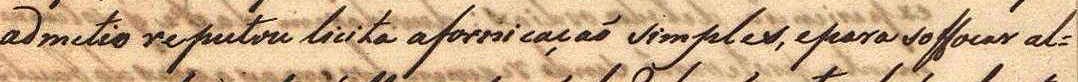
admetio reputou licita a fornicaçaõ simples, e para soffocar al
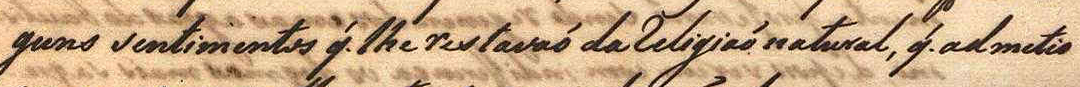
guns sentimentos q̄ lhe restavaõ da Religiaõ natural, q̄ admetio
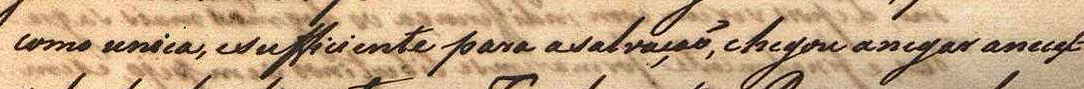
como unica, e sufficiente para a salvaçaõ, chegou a negar a neces
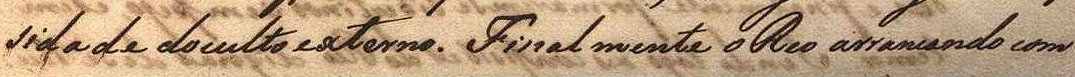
sidade do culto externo. Finalmente o Reo arrancando com
